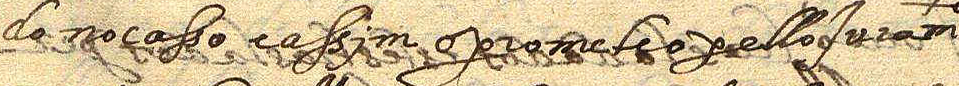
do no casso eassjm o prometeo pello Juram.to
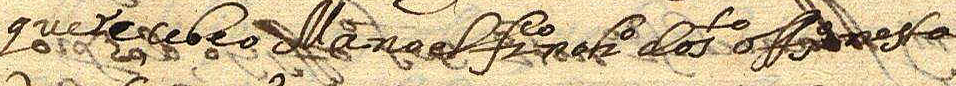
que recebeo Manoel fr.co notr.o do s.to offj.o nesta
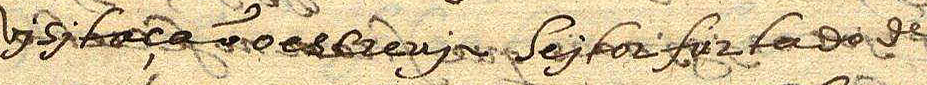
Vjsjtaçaõ o escrevj — heitor furtado de
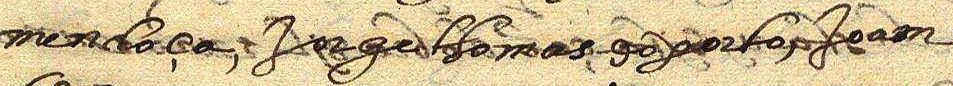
mendoça, Jorge thomas do porto, Joam
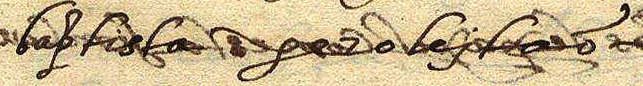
baptista pero Lejtaõ
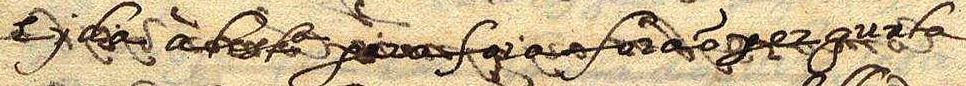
Ljda à test.a per notar.o e foraõ pergunta
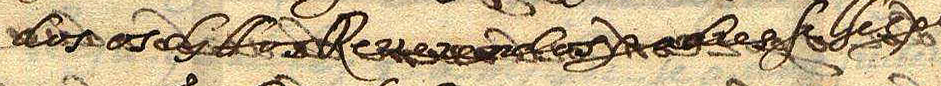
dos os dittos Reverendos padres se lhes pa
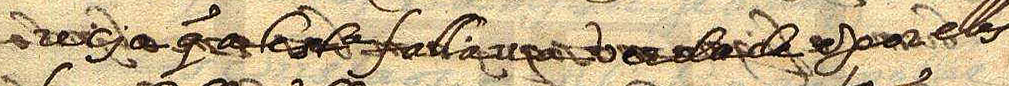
recja q̄ a test.a fallava verdade e por elles
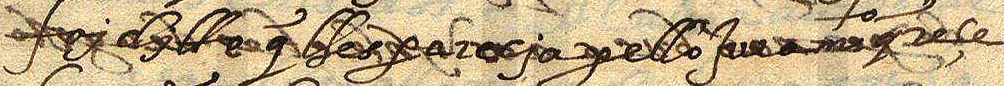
foj djtto q̄ lhes parecja pello Jurame.to q̄ reçe
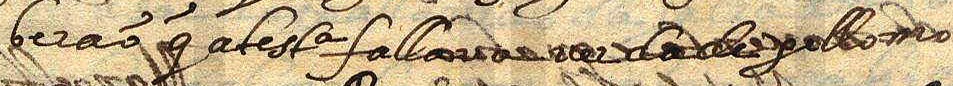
beraõ q̄ atest.a fallava verdade pello mo
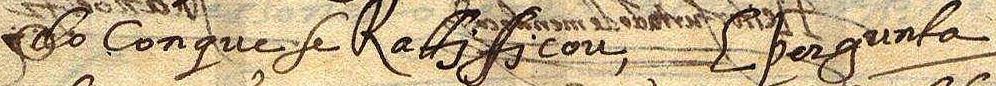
do con que se Rattjffjcou, E pergunta
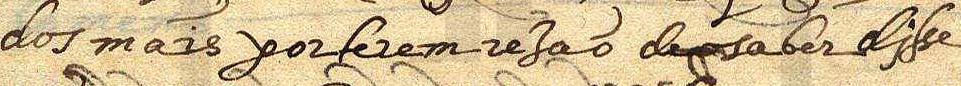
dos mais por terem rezaõ de o saber djsse
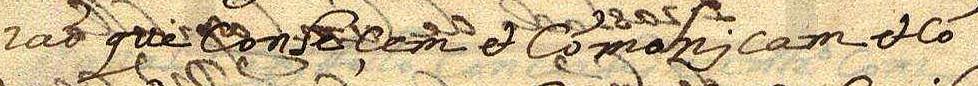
raõ que conheçem e cōmonjcam e cō
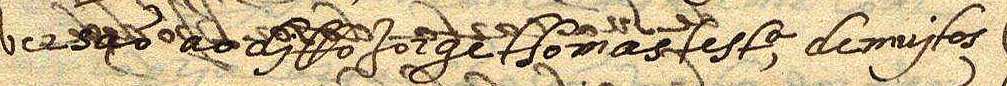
versaõ ao ditto Jorge thomas test.a, de muitos
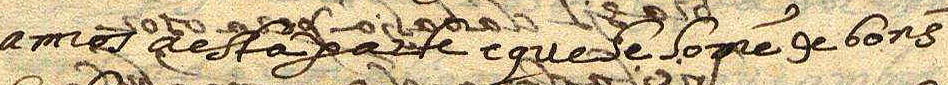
annos a esta parte e que he homē de bons
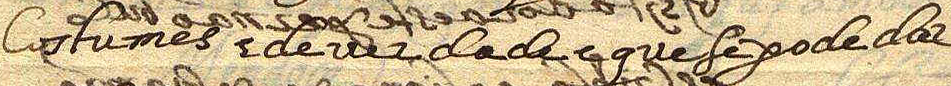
costumes e de verdade e que se pode dar
